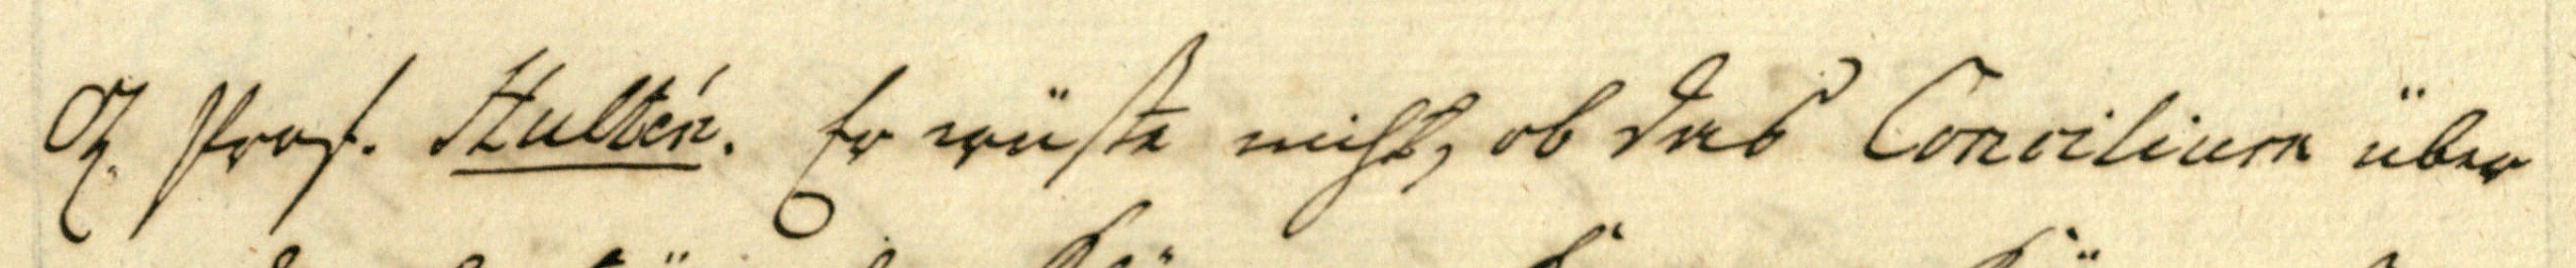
dh. Prof. Hultén. Er wüste nicht, ob das Concilium über
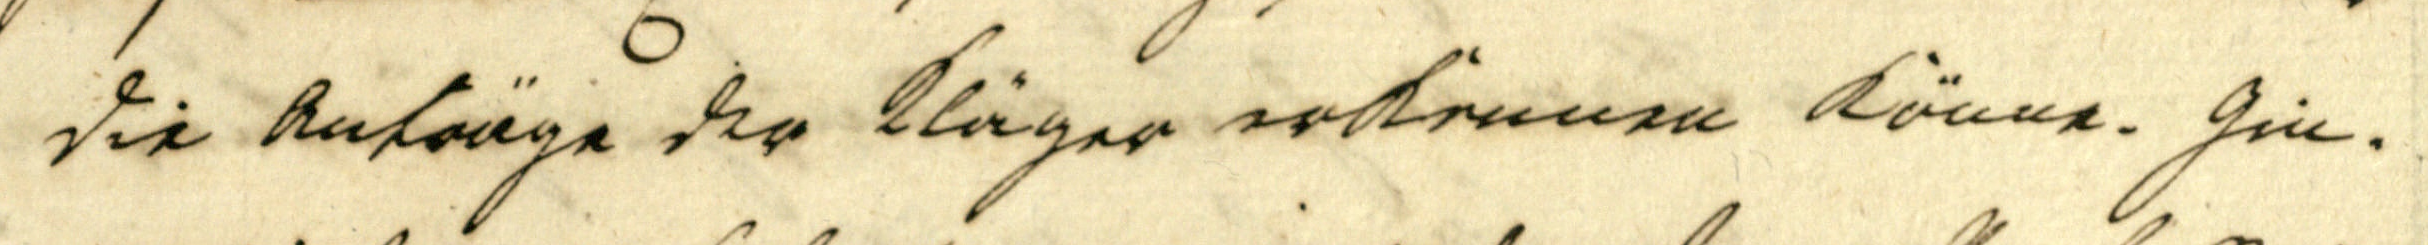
die Anträge der Kläger erkennen könne. Gin¬
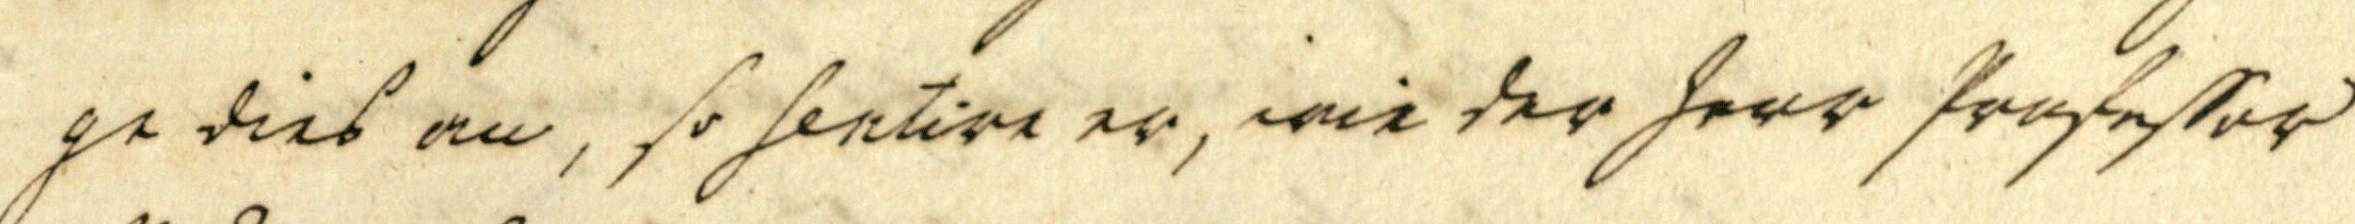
ge dies an, so sentire er, wie der Herr Professor
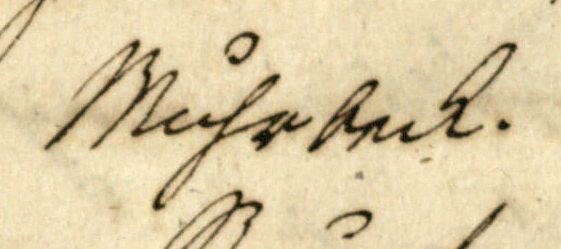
Muhrbeck.
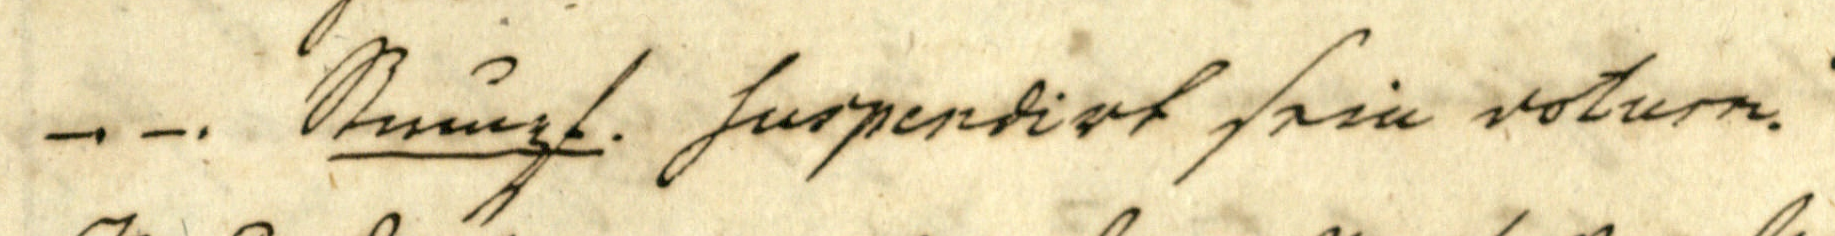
— . Stumpf. suspendirt sein votum.
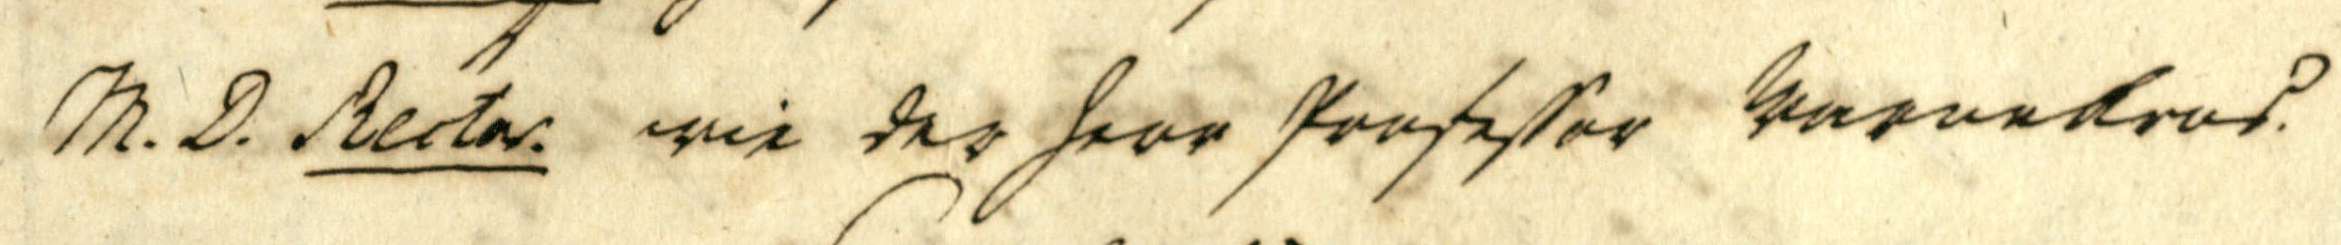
M. D. Rector. wie der Herr Professor Warnekros
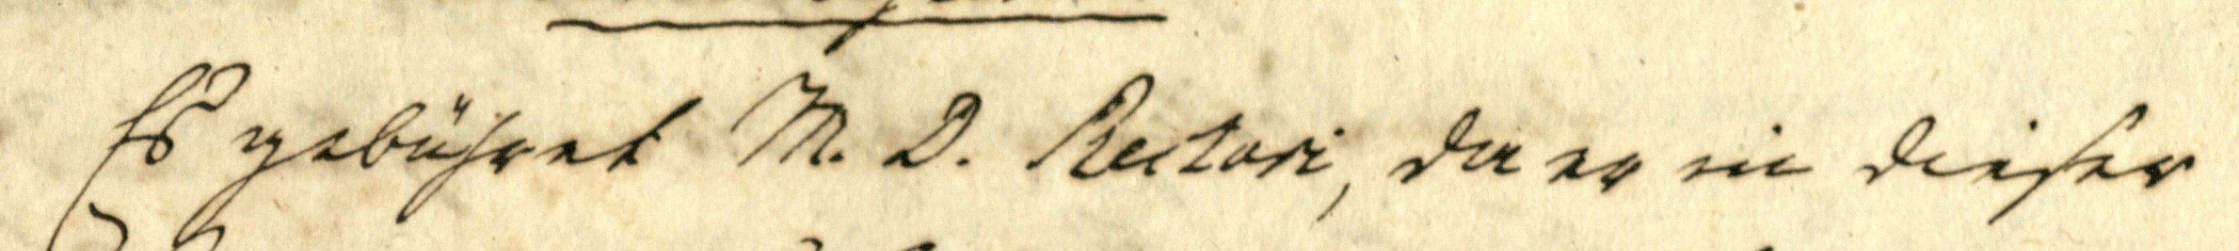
Es gebühret M. D. Rector, da er in dieser
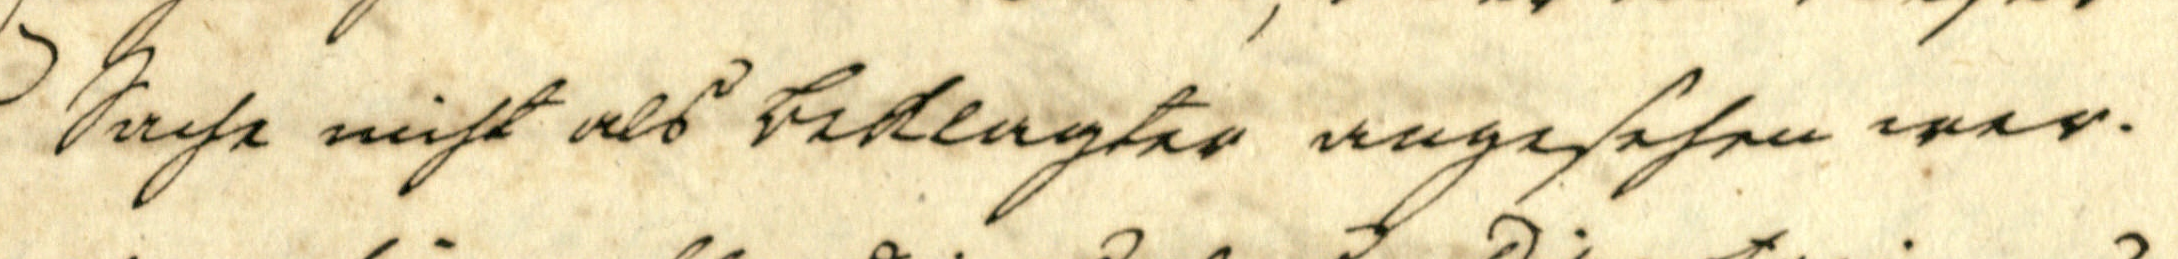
Sache nicht als Beklagter angesehen wer¬
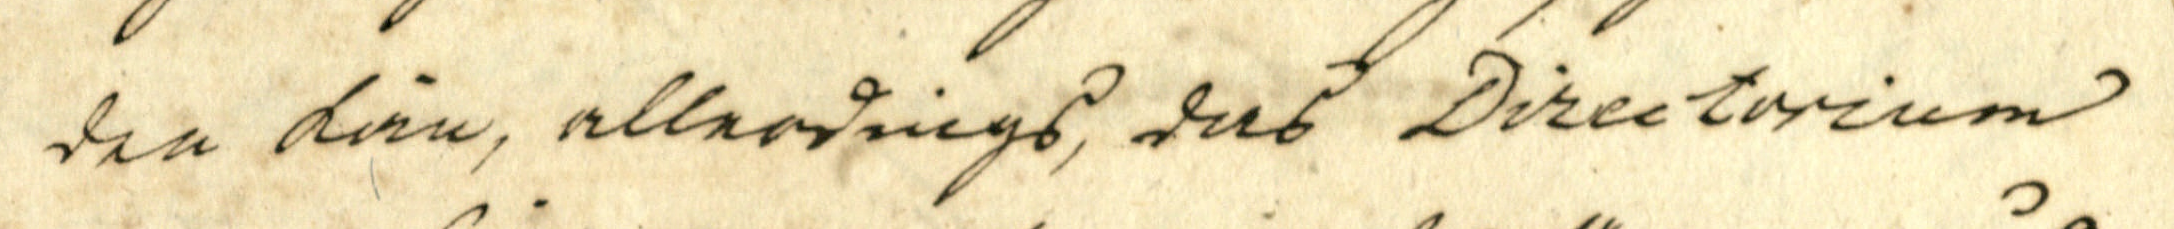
den kan, allerdings, das Directorium
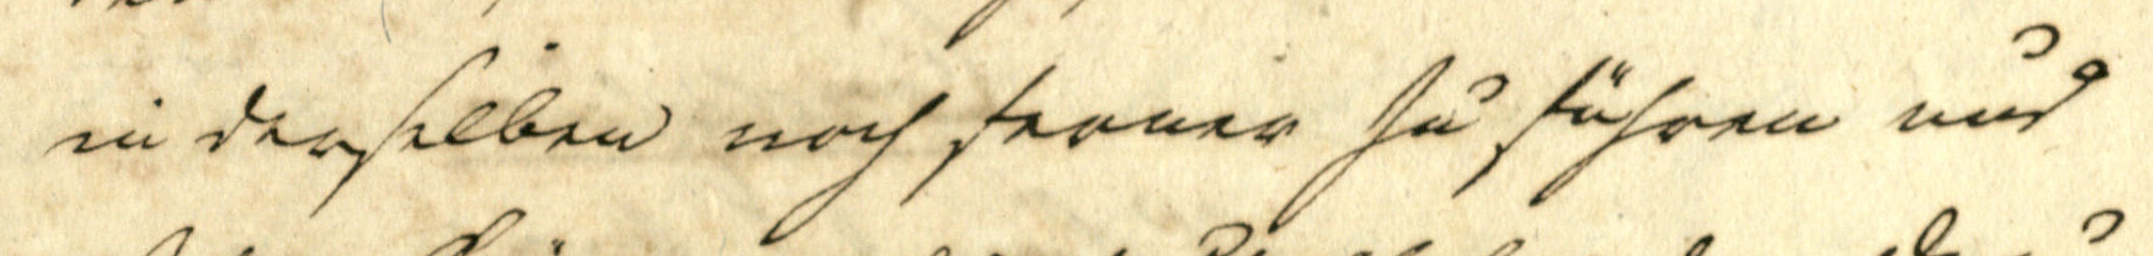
in derselben noch ferner zu führen und
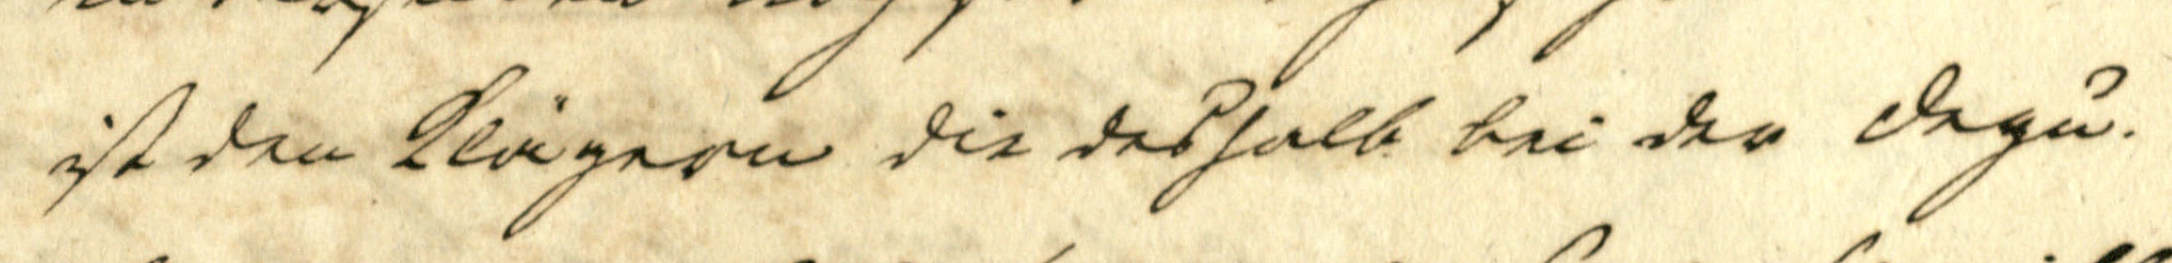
ist den Klägern die deshalb bei der depu¬
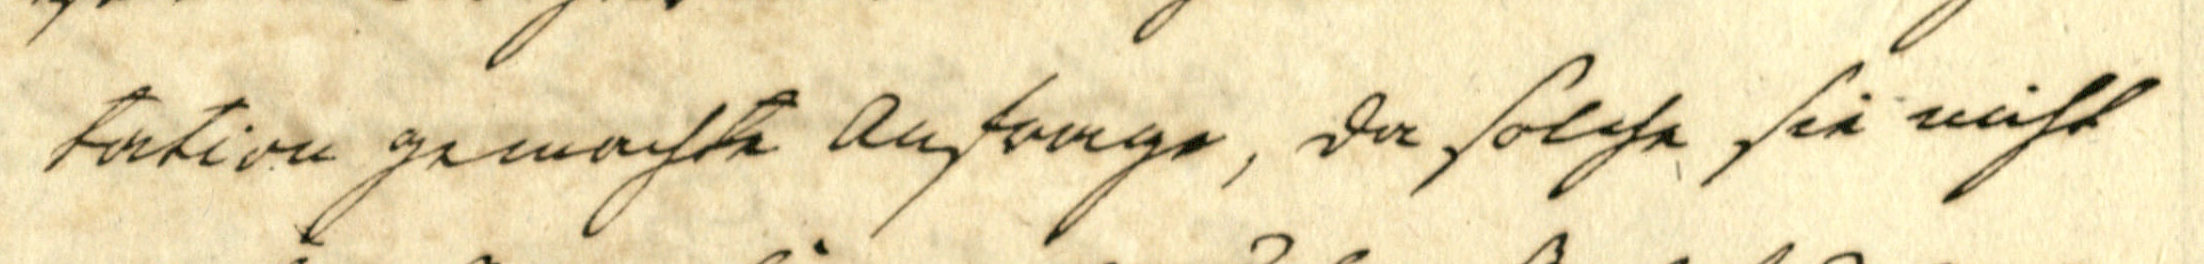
tation gemachte Anfrage, da solche sie nicht
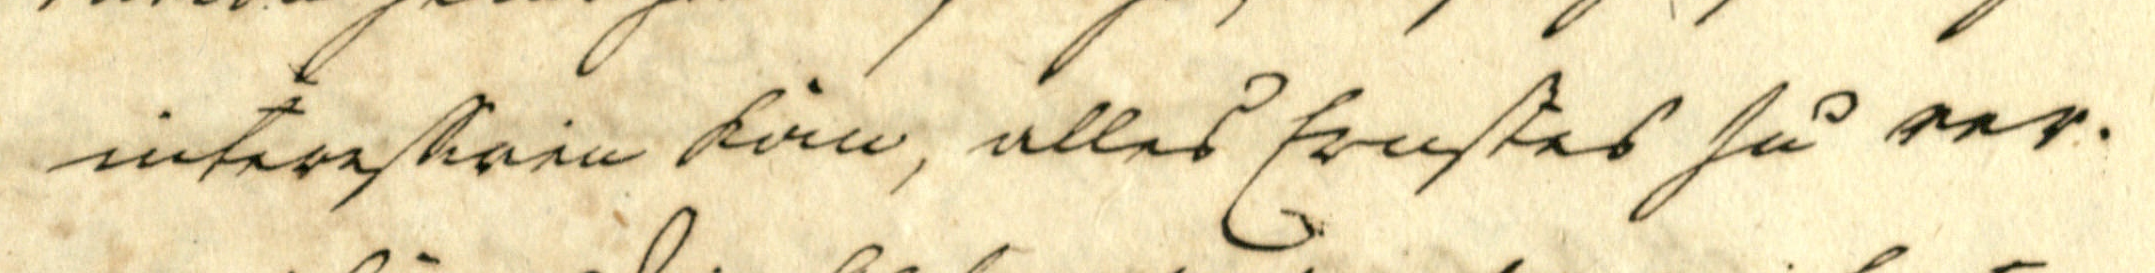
interessiren kan, alles Ernstes zu ver¬
